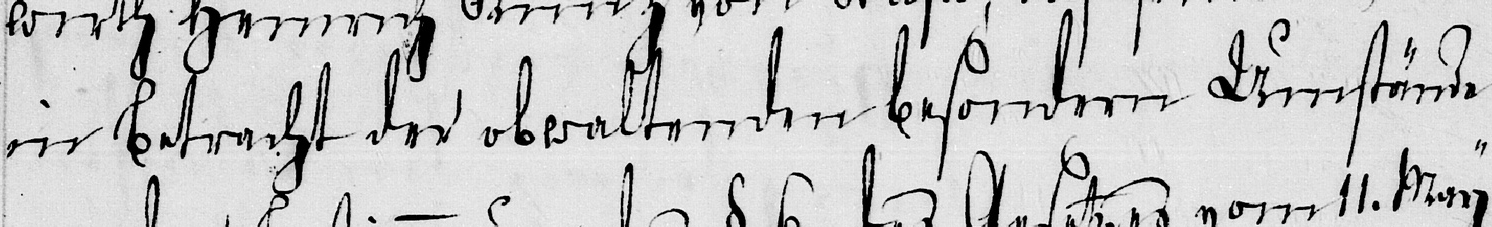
in Betracht der obwaltenden besondern Umstände
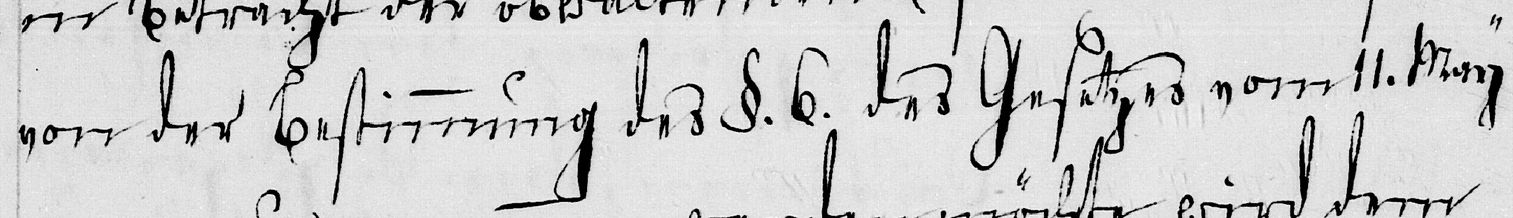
von der Bestimmung des §. 6. des Gesetzes vom 11. März
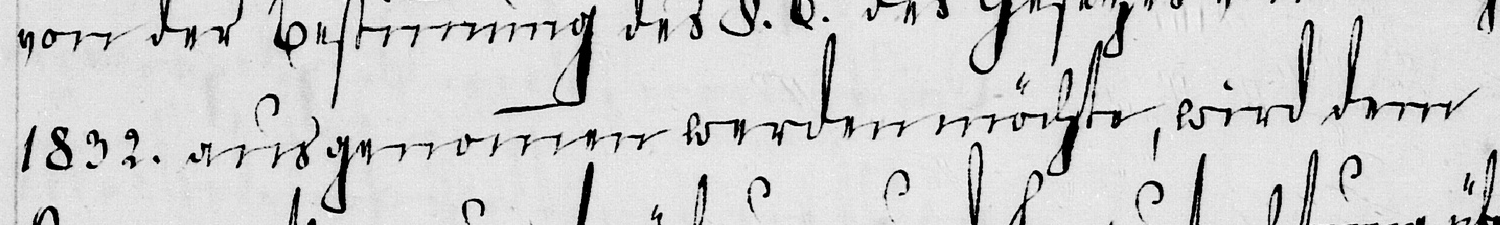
1832. ausgenommen werden möchte, wird dem
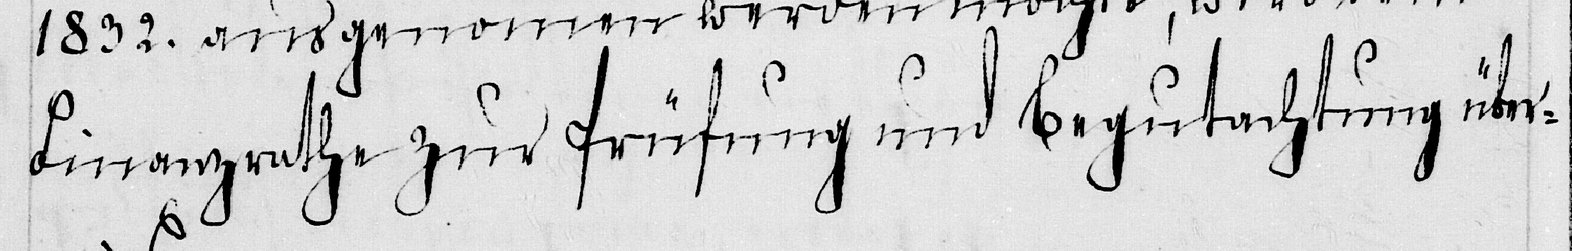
Finanzrathe zur Prüfung und Begutachtung über¬
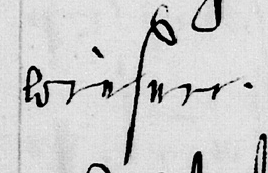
wiesen.
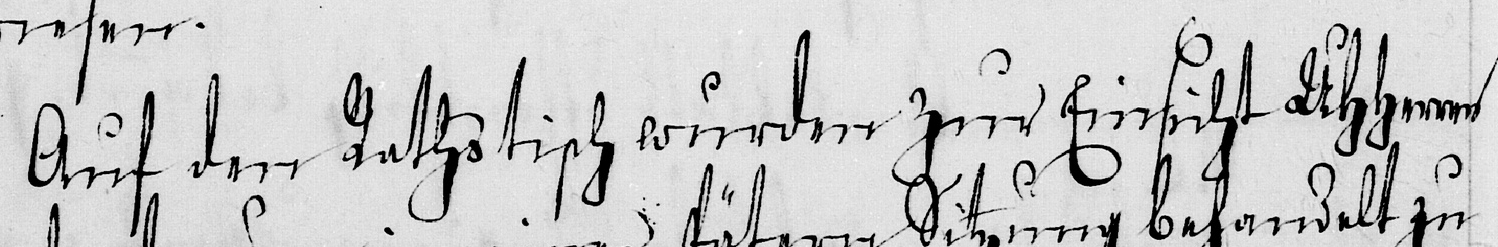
Auf dem Rathstisch wurden zur Einsicht UHHerr¬
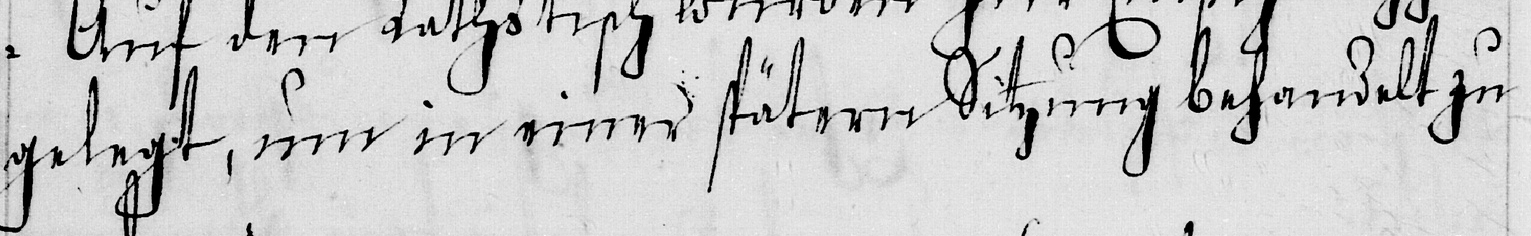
gelegt, um in einer spätern Sitzung behandelt zu
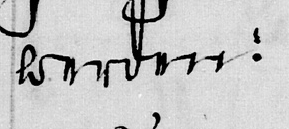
werden:
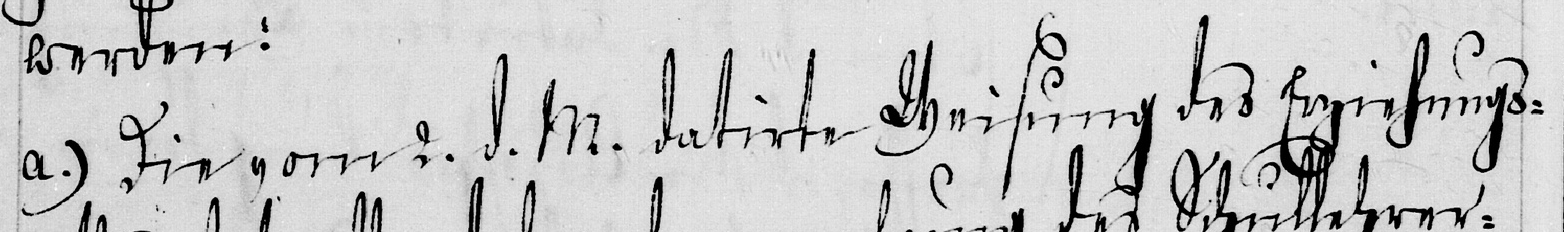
a.) Die vom 2. d. M. datirte Weisung des Erziehungs¬
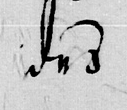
des
